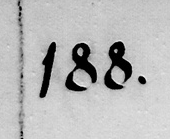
1833.
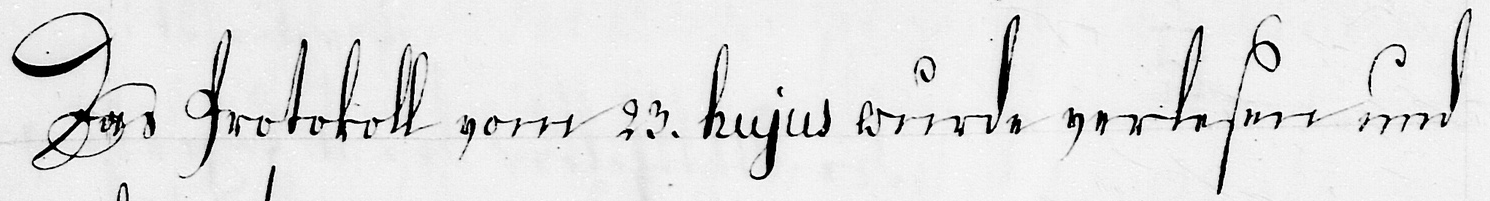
Das Protokoll vom 23. hujus wurde verlesen und
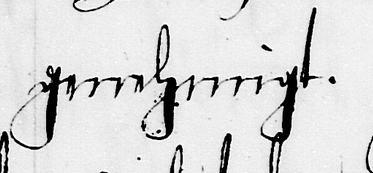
genehmigt.
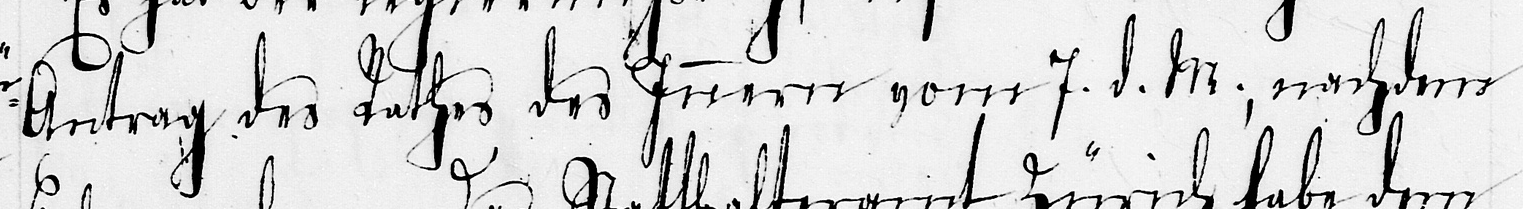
Antrag des Rathes des Innern vom 7. d. M., nachdem
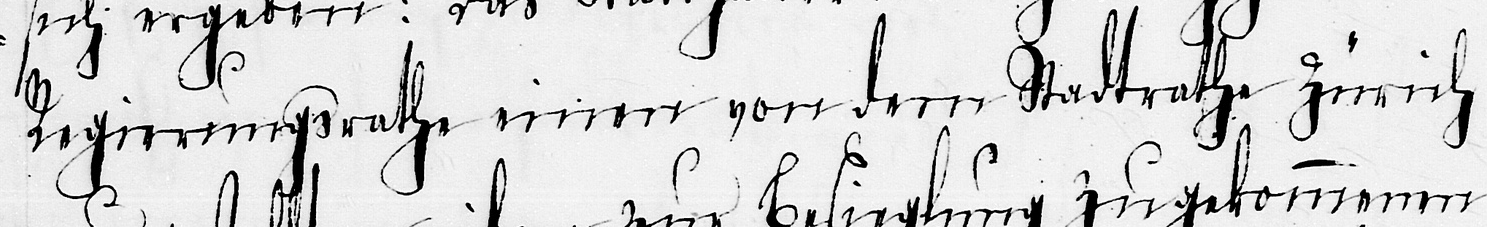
Regierungsrathe einen von dem Stadtrathe Zürich
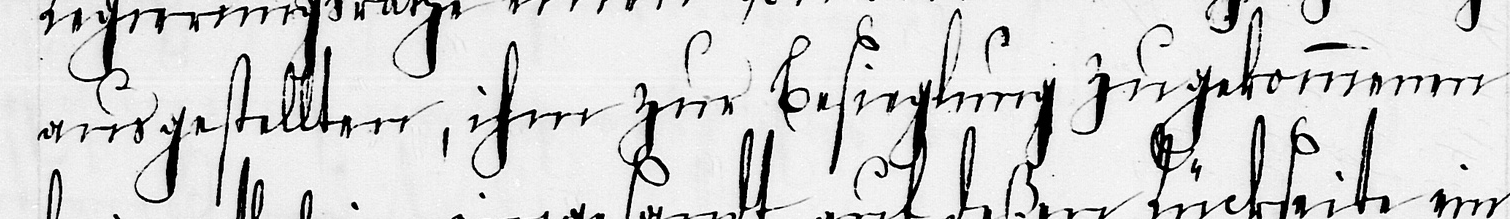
ausgestellten, ihm zur Besieglung zugekommenen
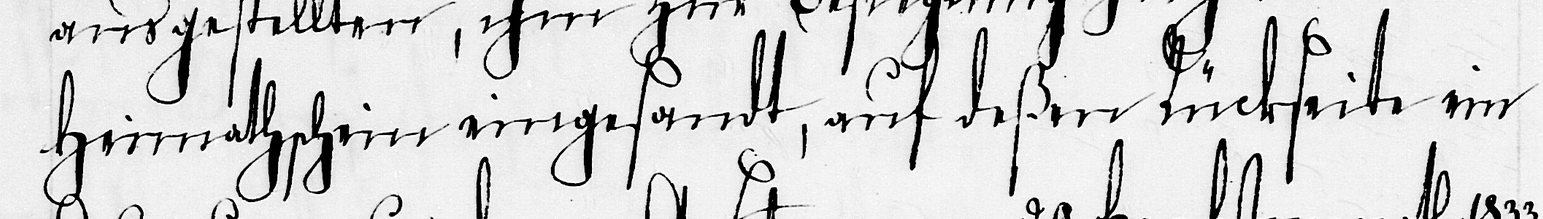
Heimathschein eingesandt, auf deßen Rückseite ein
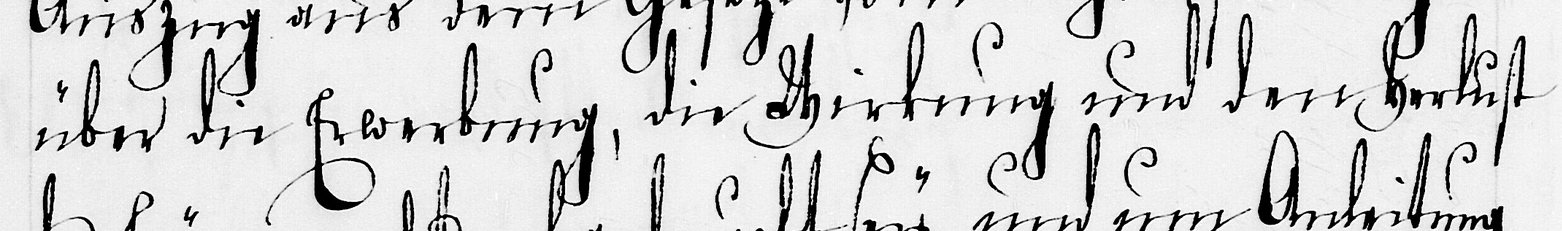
über die Erwerbung, die Wirkung und den Verlust
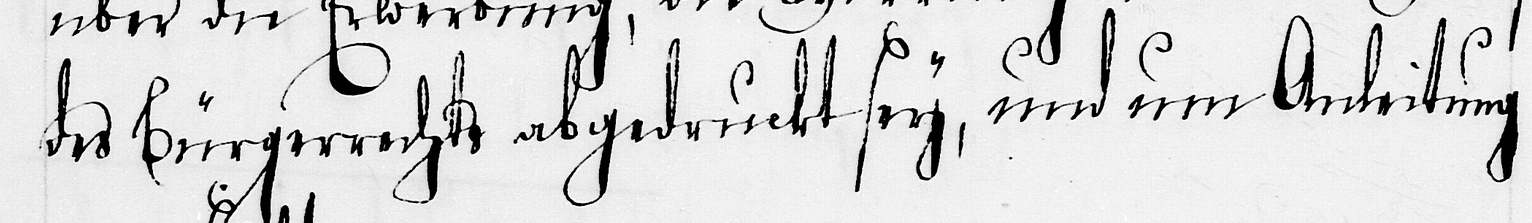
des Bürgerrechts abgedruckt sey, und um Anleitung
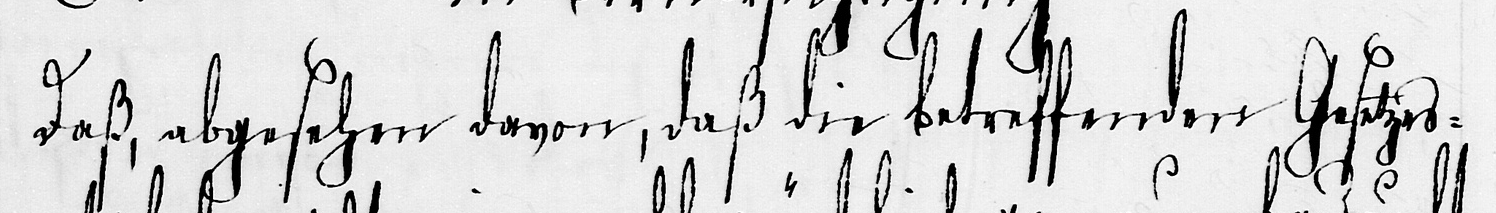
Daß, abgesehen davon, daß die betreffenden Gesetz¬
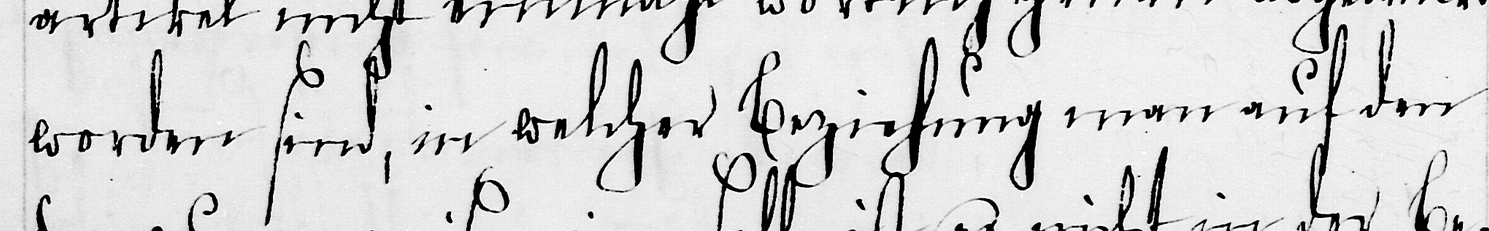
worden sind, in welcher Beziehung man auf den
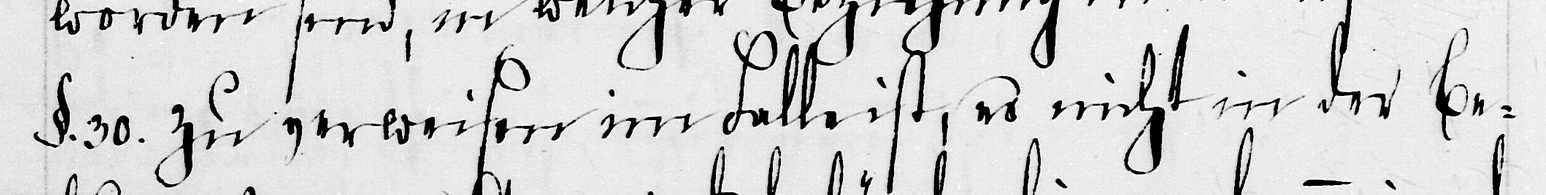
30. zu verweisen im Falle ist, es nicht in der Be¬
